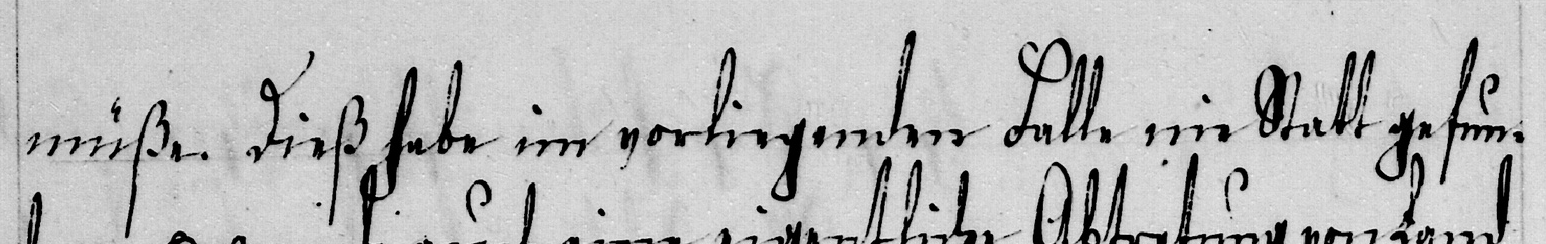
müße. Dieß habe im vorliegenden Falle nie Statt gefu¬
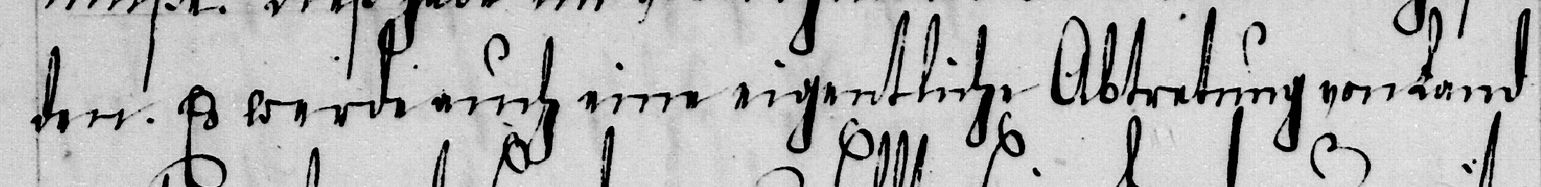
nden. Es werde auch eine eigentliche Abtretung von Land
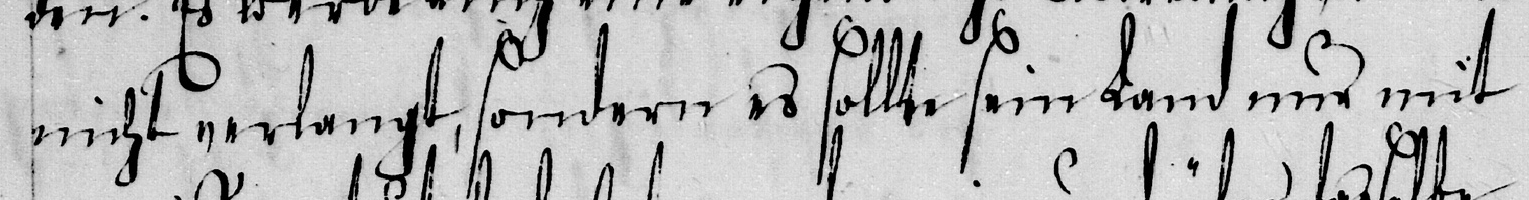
nicht verlangt, sondern es sollte sein Land nur mit
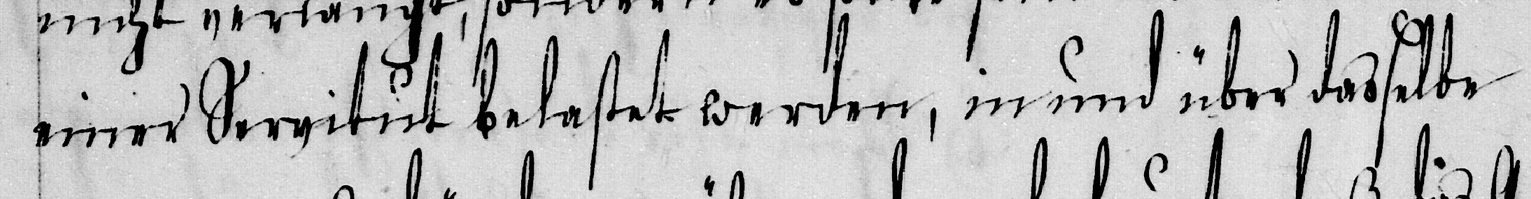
einer Servitut belastet werden, in und über dasselbe
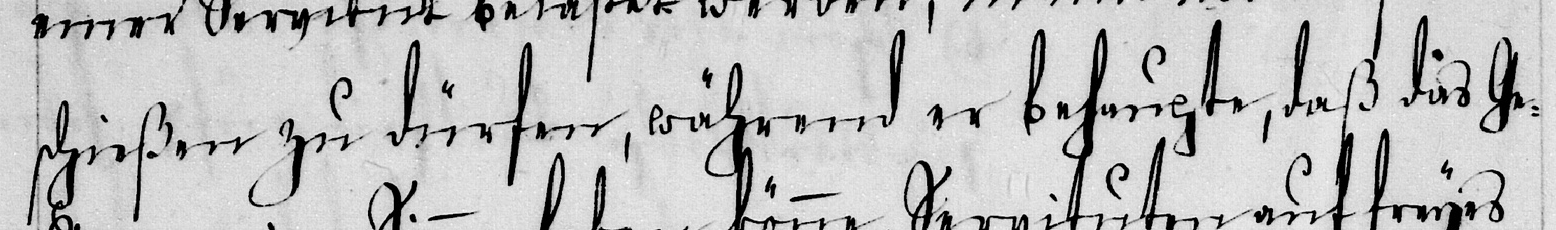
schießen zu dürfen, während er behaupte, daß das G¬
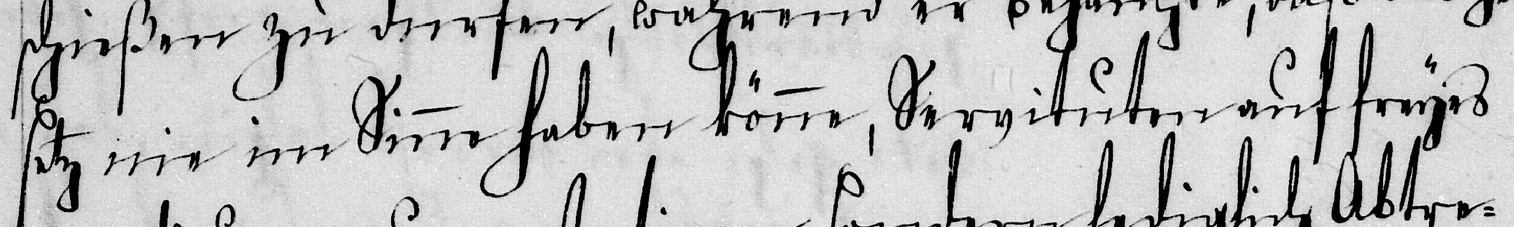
etz nie im Sinn haben könne, Servituten auf freyes
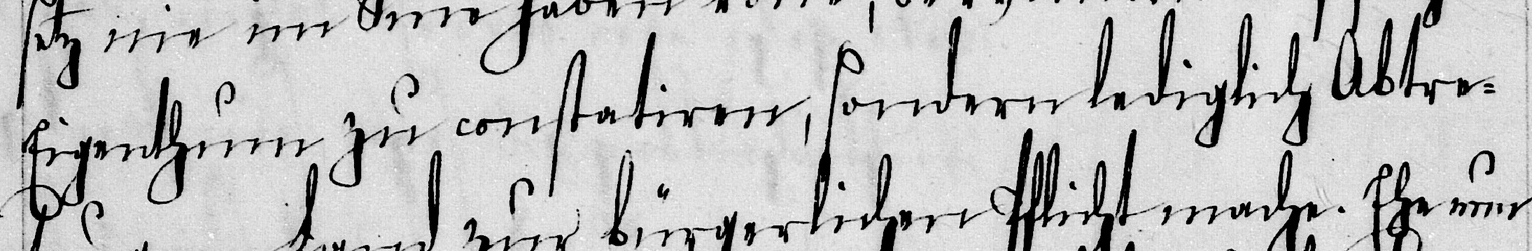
Eigenthum zu constatiren, sondern lediglich Abtre¬
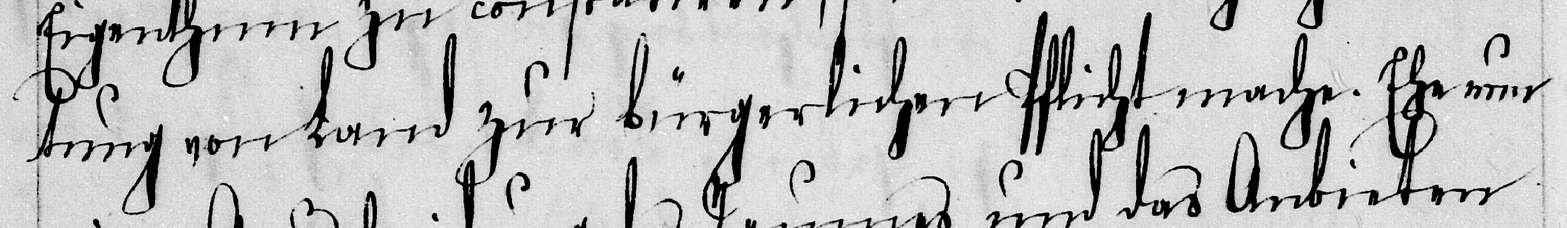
tung von Land zur bürgerlichen Pflicht mache. Ehe nun
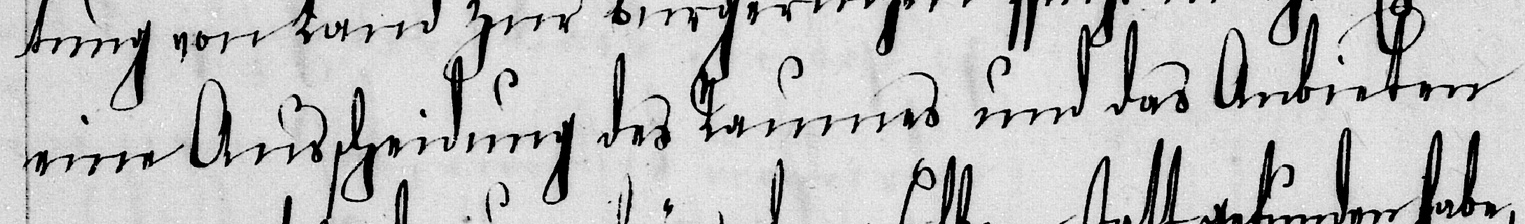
eine Ausscheidung des Raumes und das Anbieten
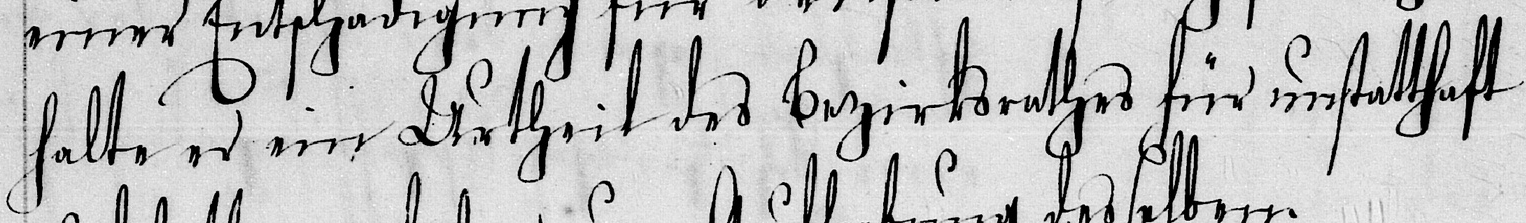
halte er ein Urtheil des Bezirksrathes für unstatthaft
